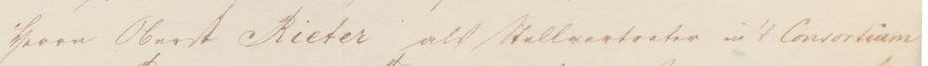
Herrn Oberst Rieter als Stellvertreter in's Consortium
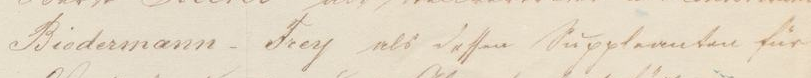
"«Biedermann-Frey » als dessen Suppleanten für
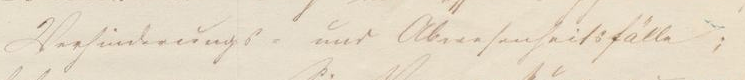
Verhinderungs- und Abwesenheitsfälle;
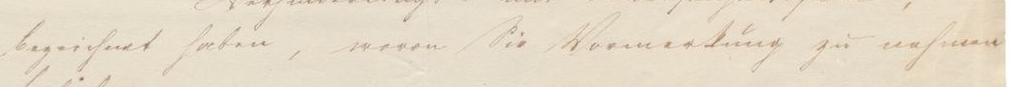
bezeichnet haben, wovon Sie Vormerkung zu nehmen
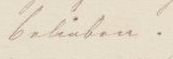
belieben.
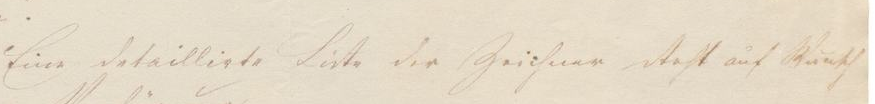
Eine detaillirte Liste der Zeichner steht auf Wunsch
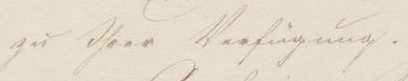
zu Ihrer Verfügung.
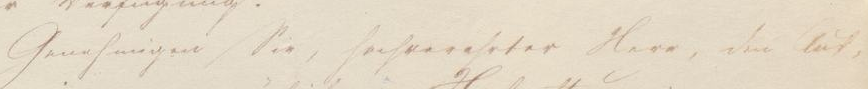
Genehmigen Sie, hochverehrter Herr, den Aus-
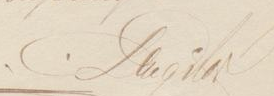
... Lengstorf
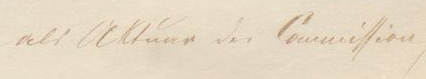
alt Aktuar der Commission
